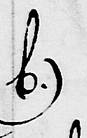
c.)
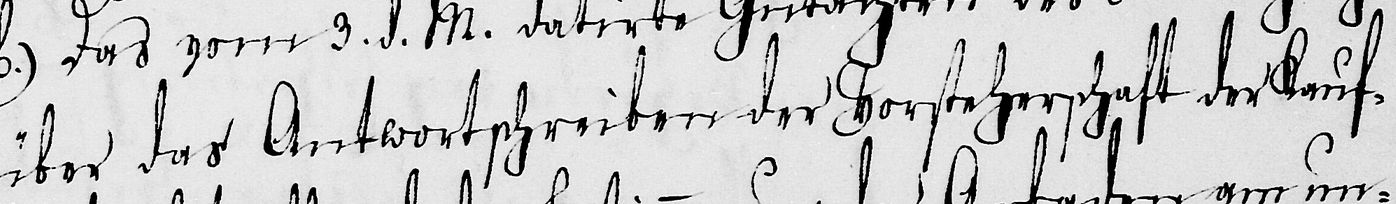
über das Antwortschreiben der Vorsteherschaft der Kauf¬
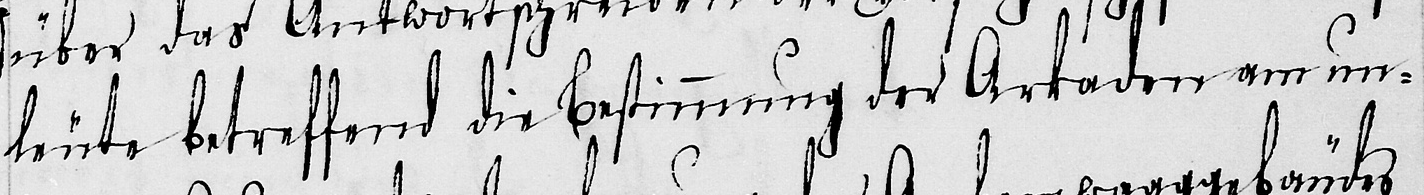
leute betreffend die Bestimmung der Arkaden am un¬
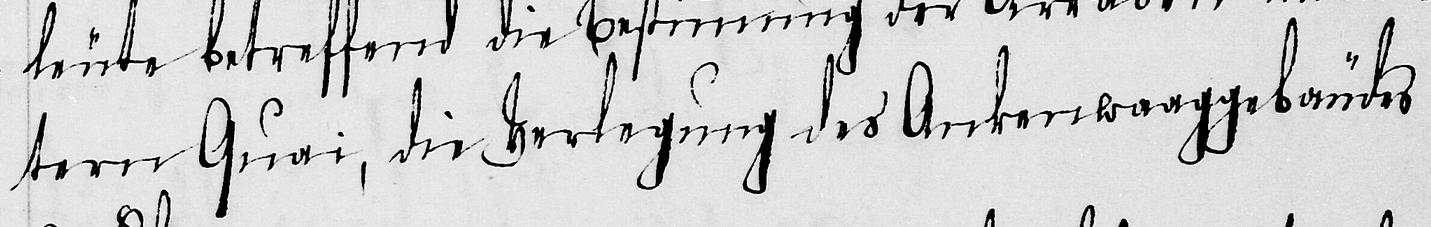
tern Quai, die Verlegung des Ankenwaaggebäudes
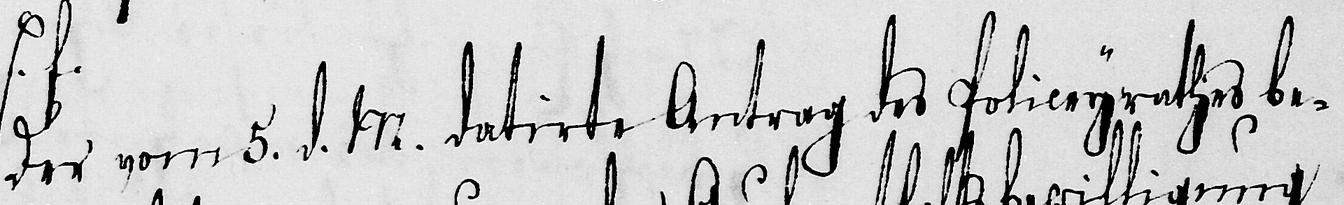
Der vom 5. d. M. datirte Antrag des Policeyrathes
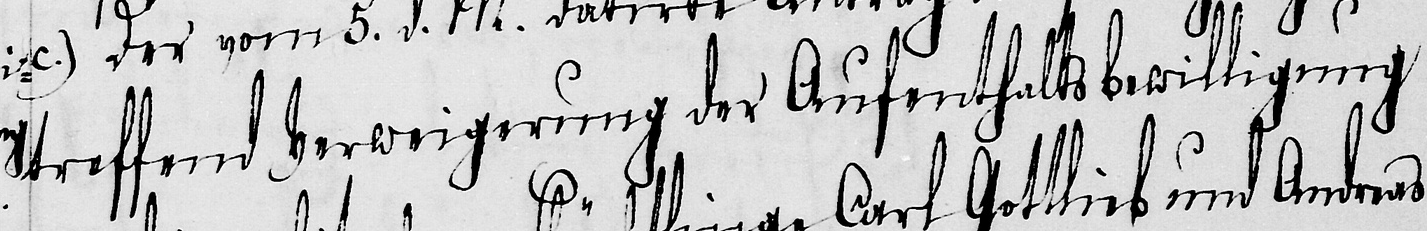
treffend Verweigerung der Aufenthaltsbewilligung
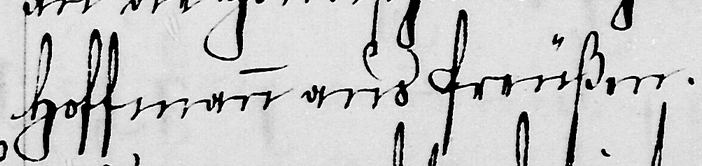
Hoffmann aus Preußen.
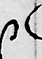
s.
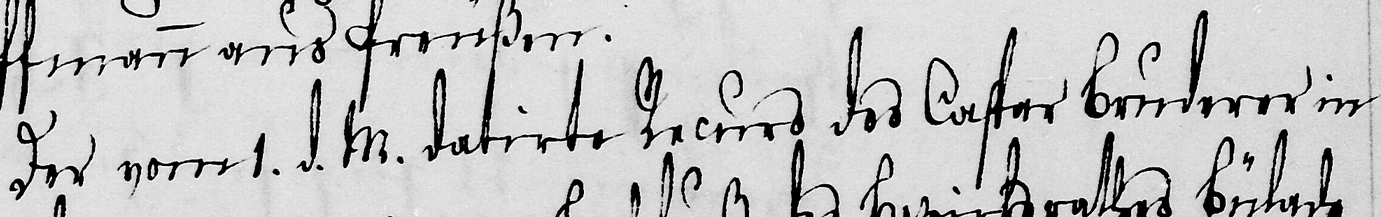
Der vom 1. d. M. datirte Recurs des Caspar Bruderer in
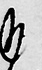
f.
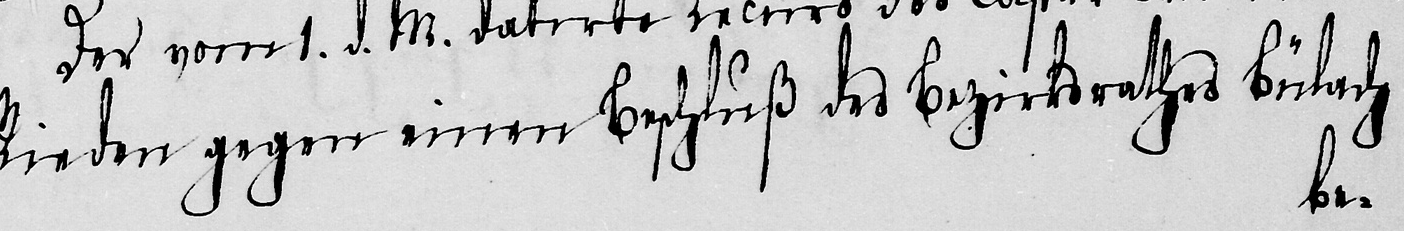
Rieden gegen einen Beschluß des Bezirksrathes Bülach
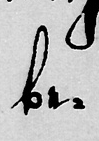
ge¬
